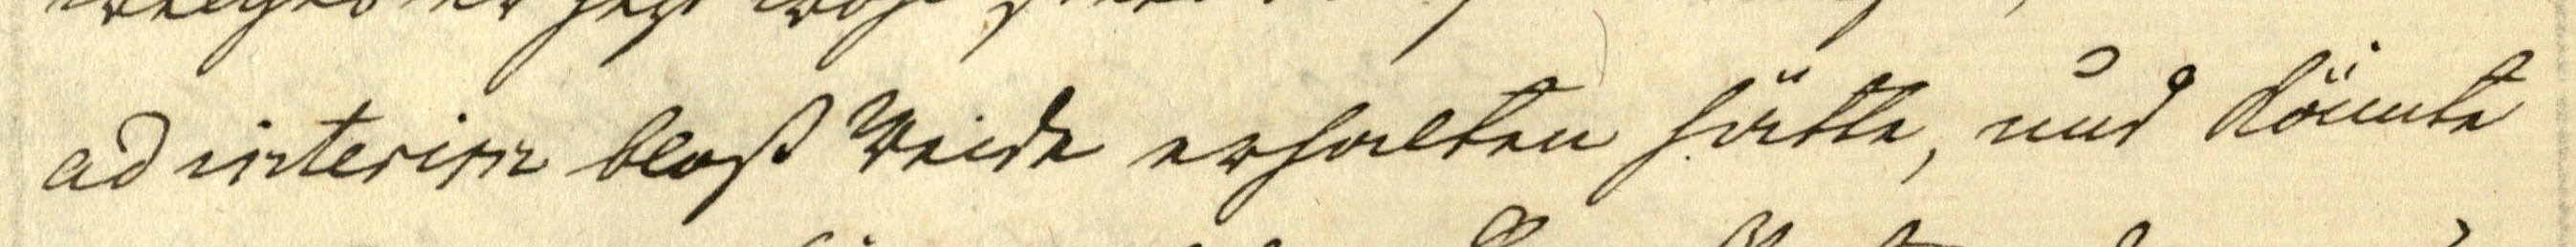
ad interim bloß Weide erhalten hätte, und könnte
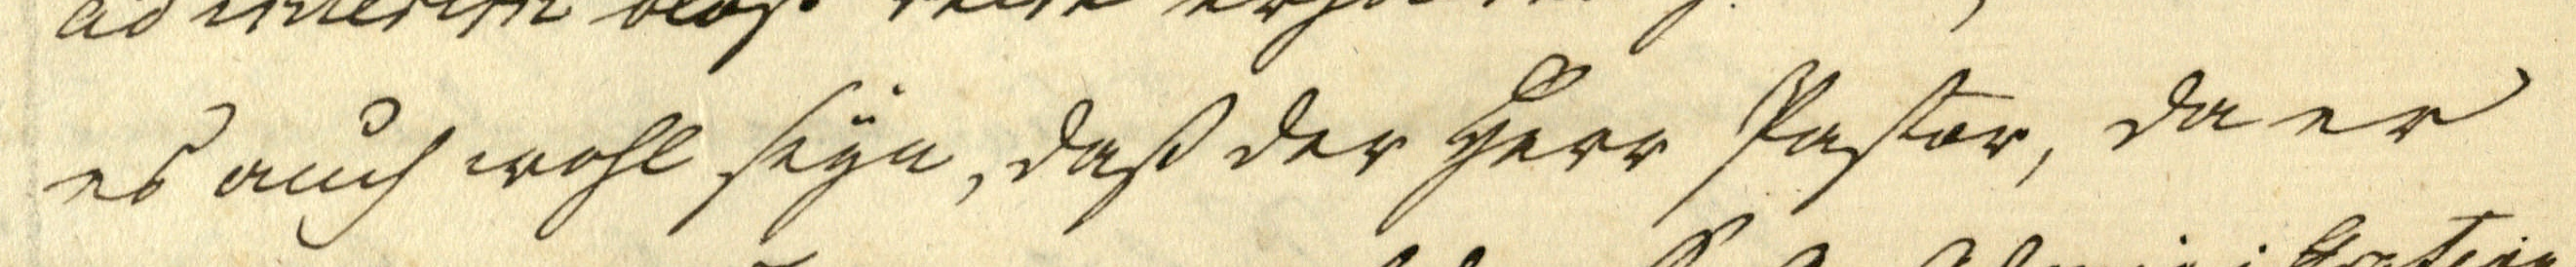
es auch wohl seÿn, daß der Herr Pastor, da er
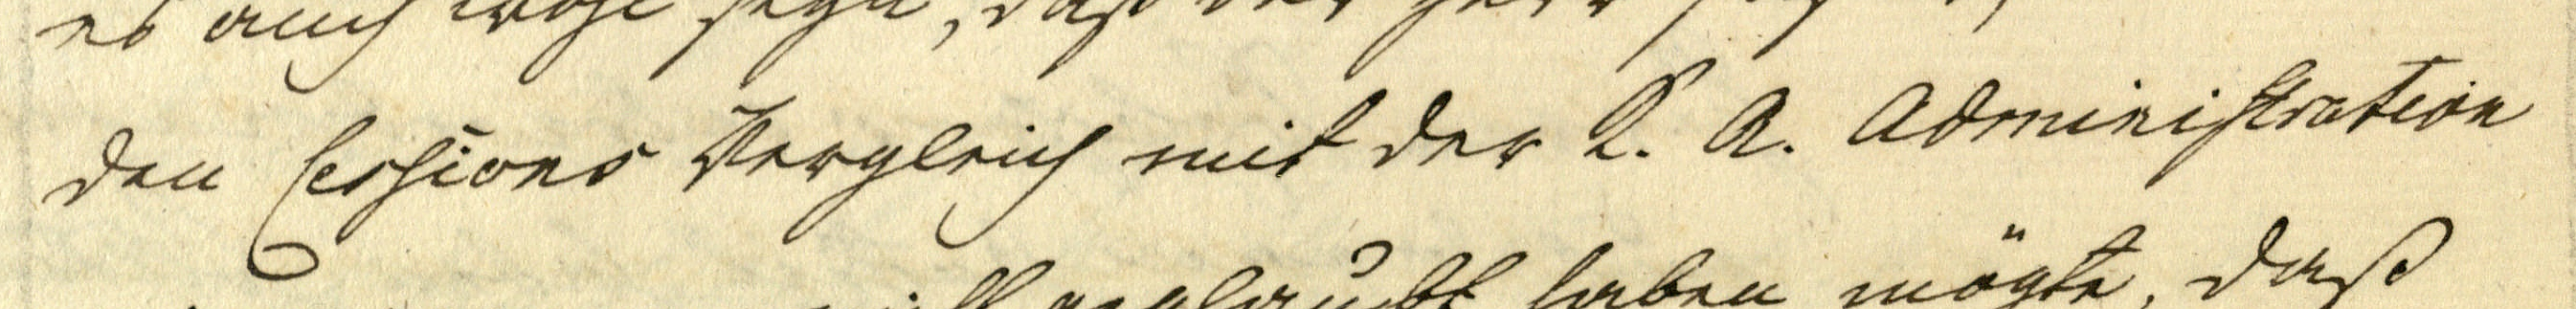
den Cessions Vergleich mit der K. A. Administration
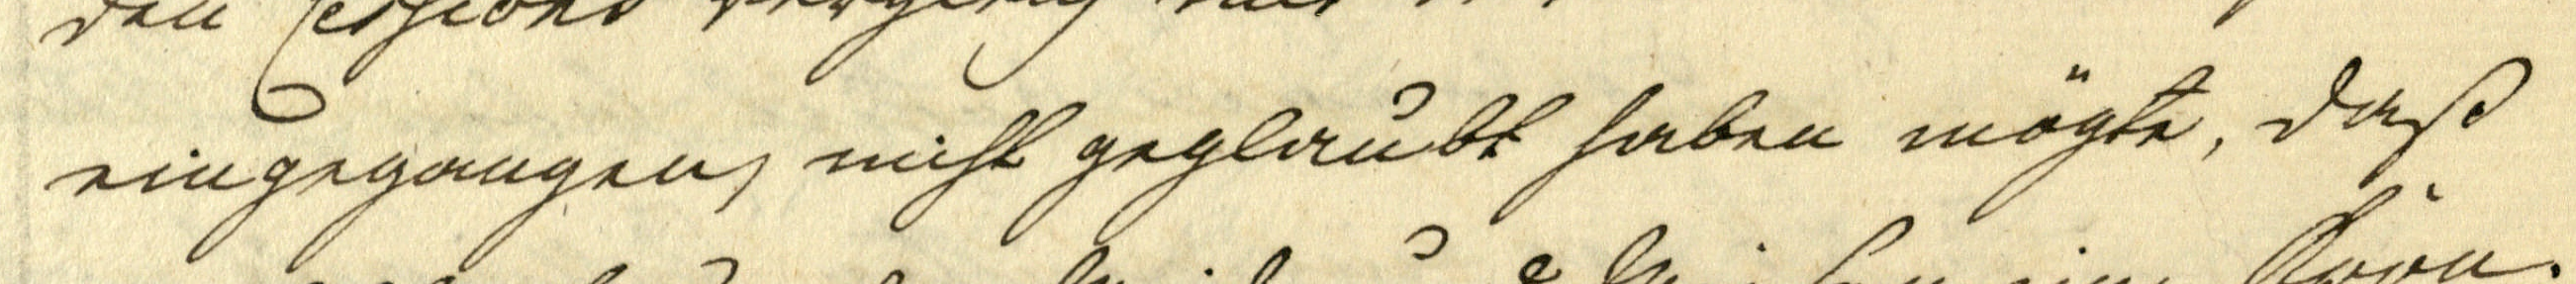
eingegangen, nicht geglaubt haben mögte, daß
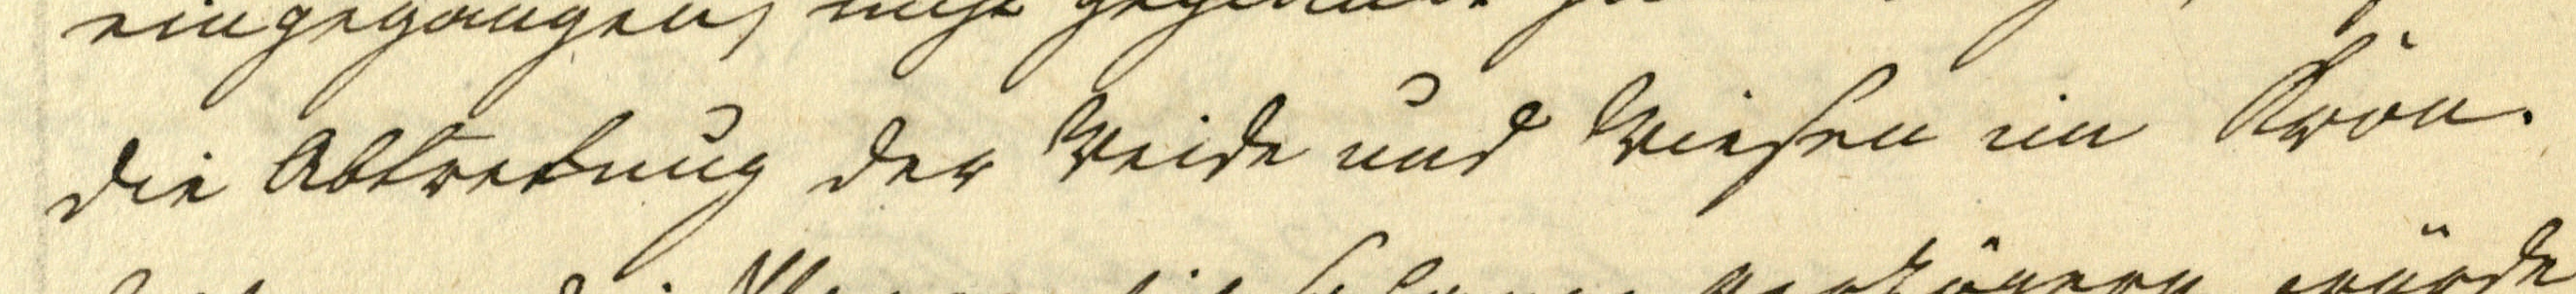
die Abtretung der Weide und Wiesen im Kron¬
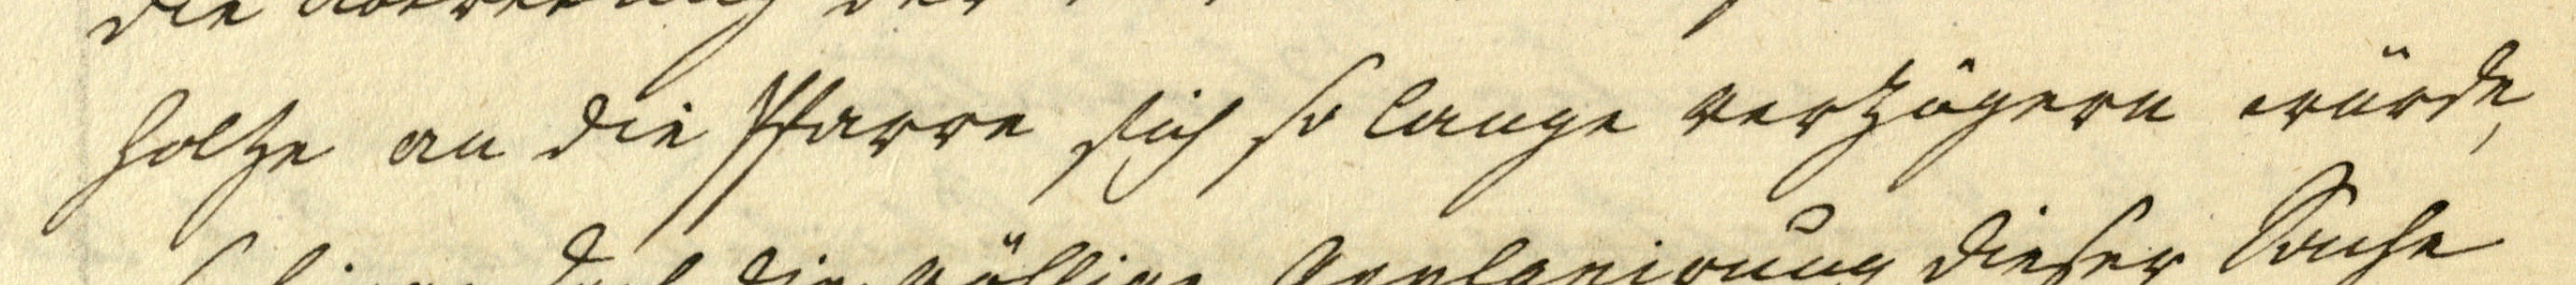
Holze an die Pfarre sich so lange verzögern würde,
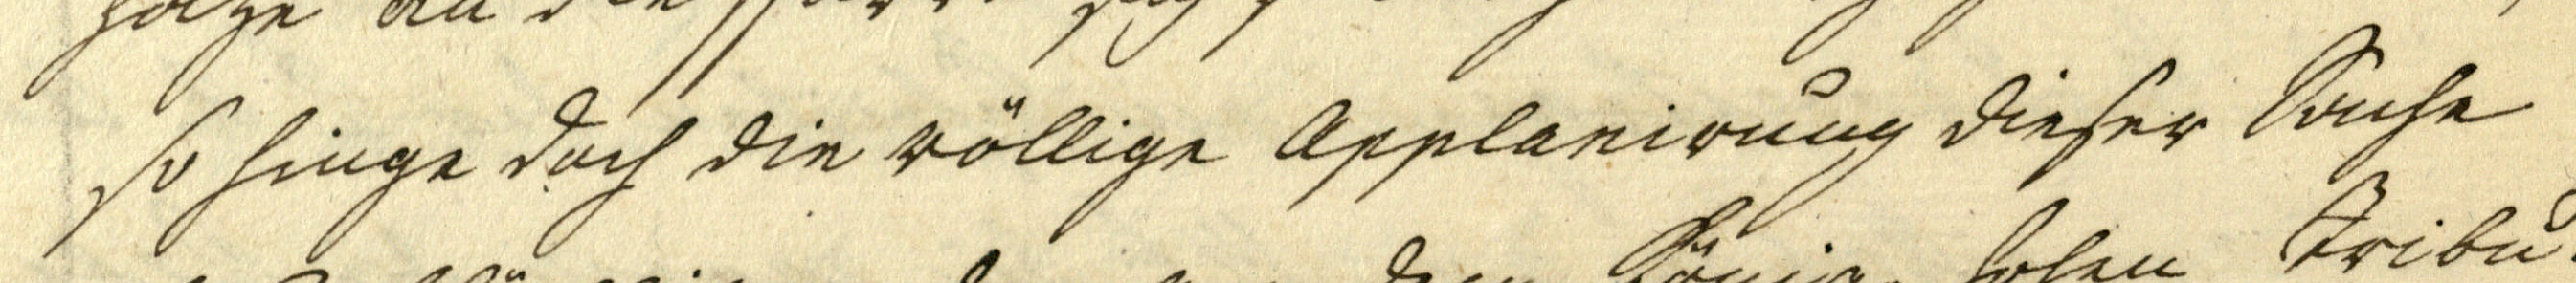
so hinge doch die völlige Applanirung dieser Sache
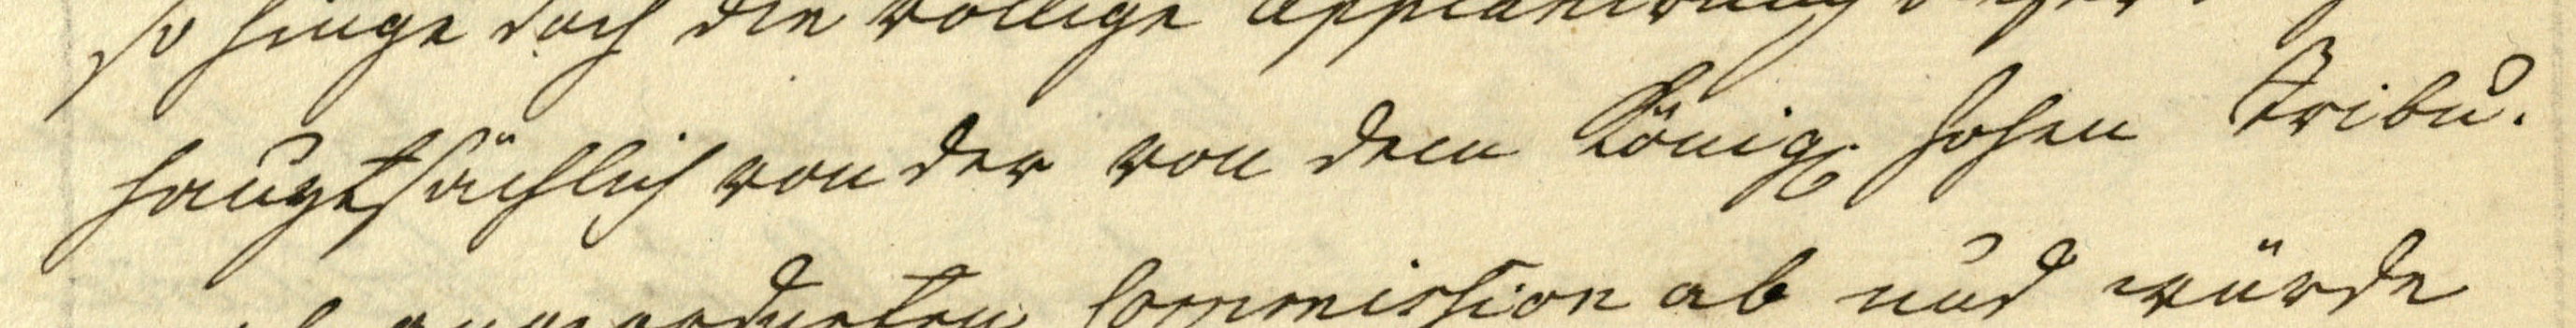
hauptsächlich von der von dem Königl. hohen Tribu¬
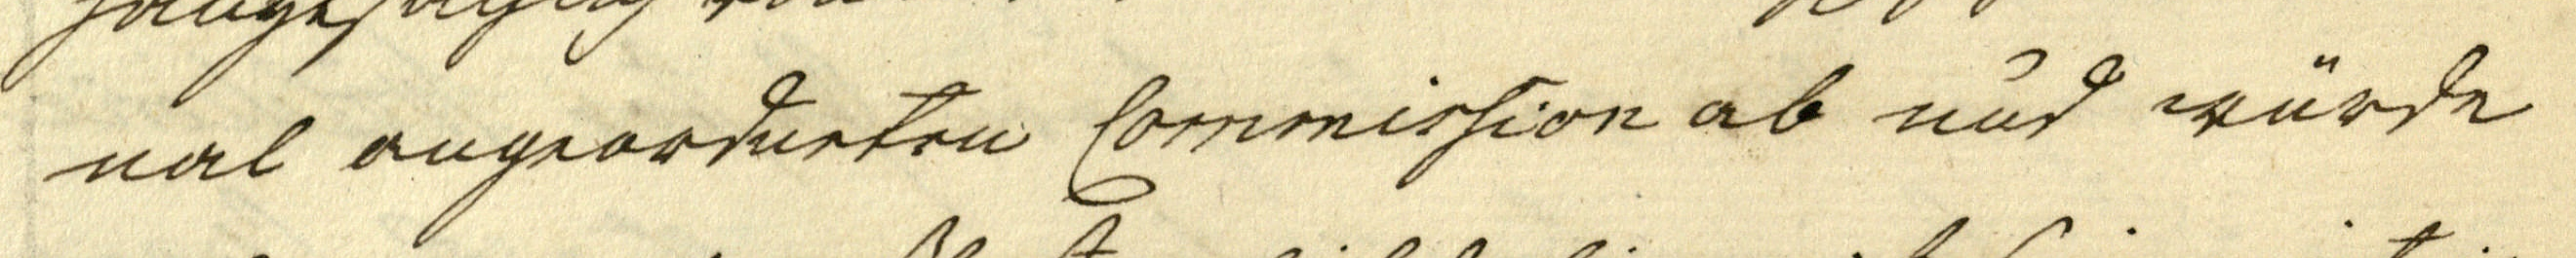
nal angeordneten Commission ab und würde
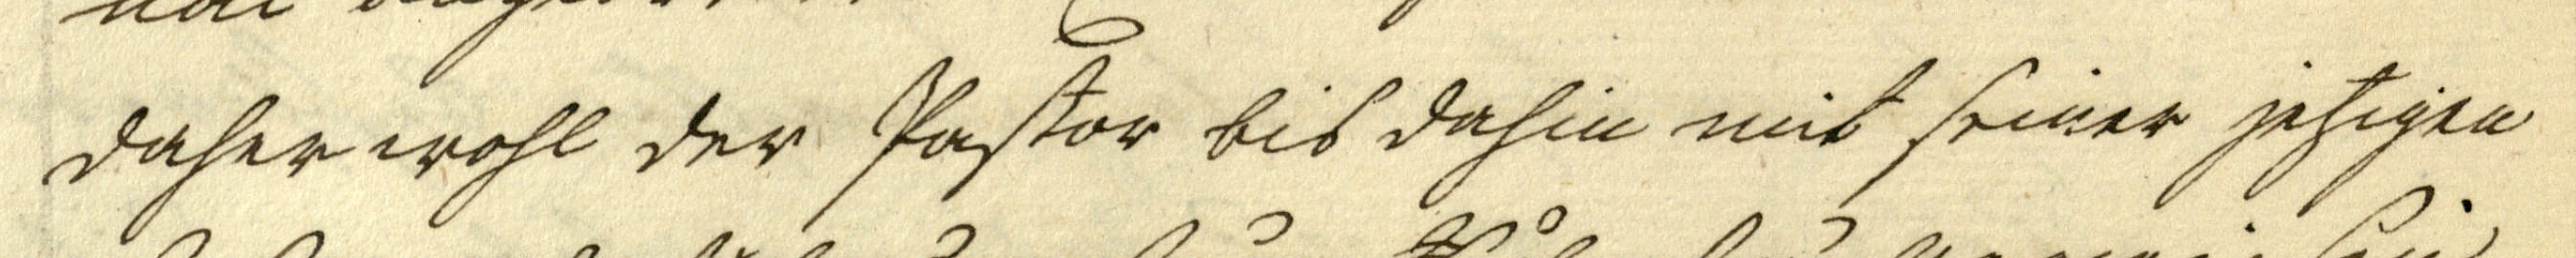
daher wohl der Pastor bis dahin mit seiner jetzigen
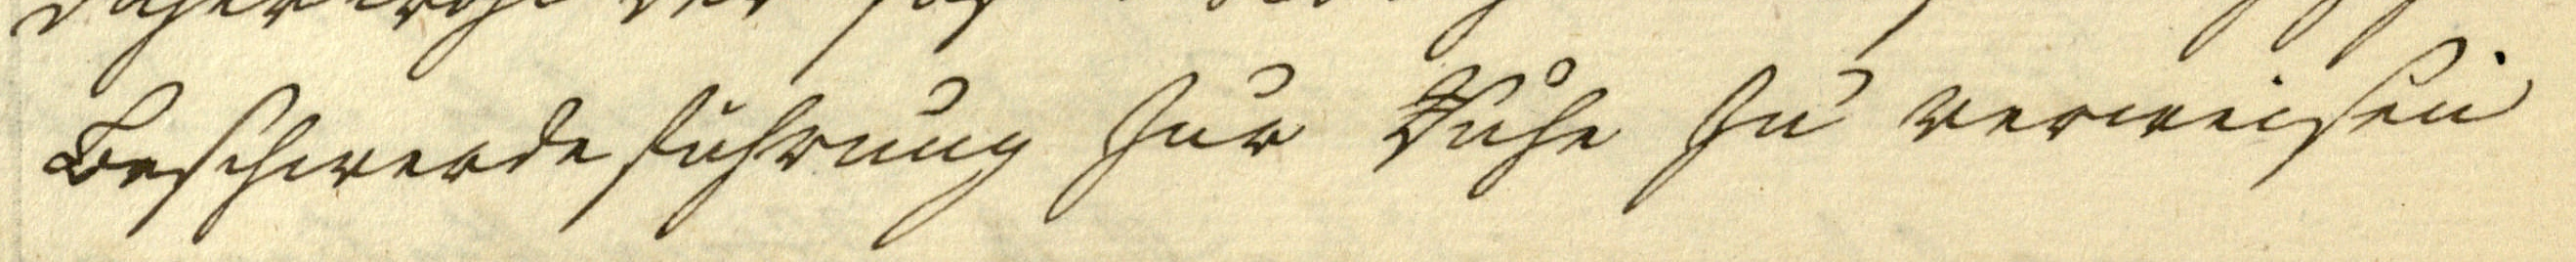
Beschwerde führung zur Ruhe zu verweisen
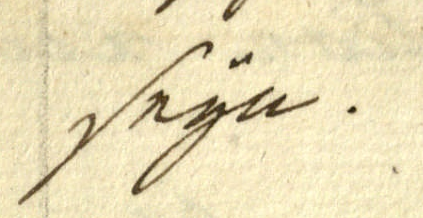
seÿn.
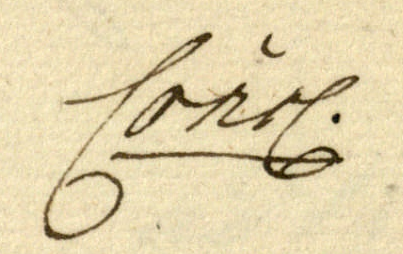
Concl.
